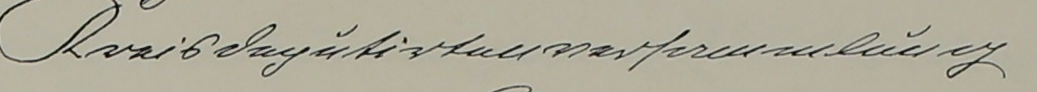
Kreisdeputirtenversammlung
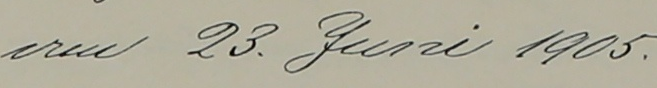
am 23. Juni 1905.
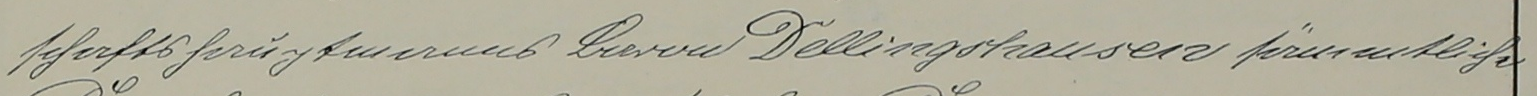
schaftshauptmanns Baron Dellingshausen sämmtliche
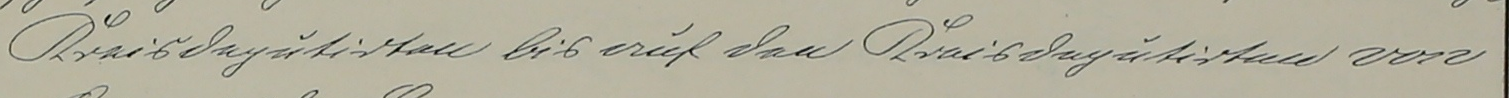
Kreisdeputirten bis auf den Kreisdeputirten von
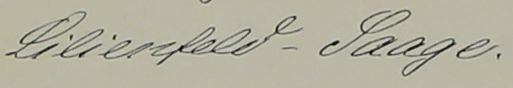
Lilienfeld-Saage.
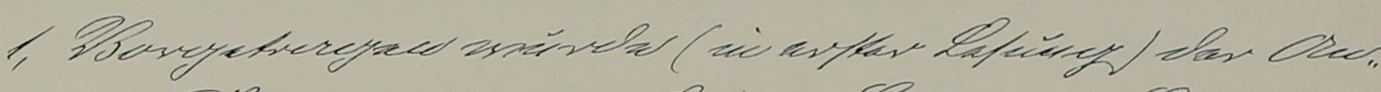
1. Vorgetragen wurde (in erster Lesung) der An-
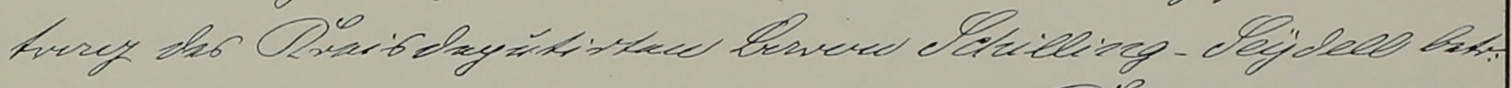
trag des Kreisdeputirten Baron Schilling-Seydell betr.
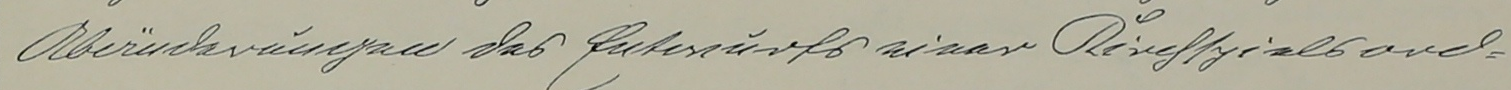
Abänderungen des Entwurfs einer Kirchspielsord-
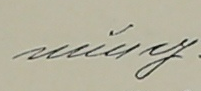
nung.
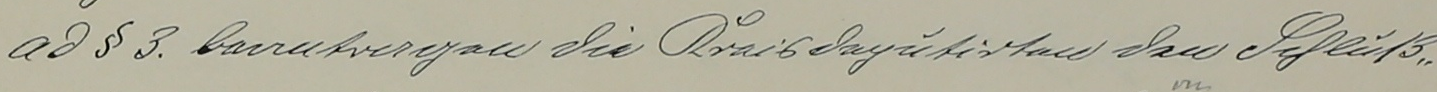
ad § 3. beantragen die Kreisdeputirten den Schluß-
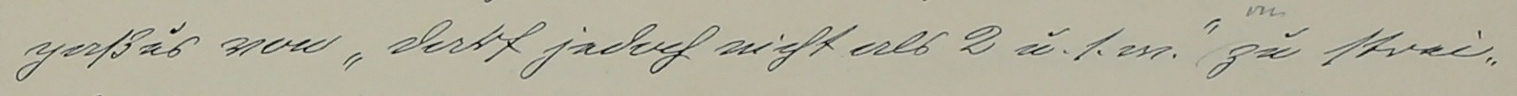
paßus von „darf jedoch nicht als 2 u.s.w.“ zu strei-
